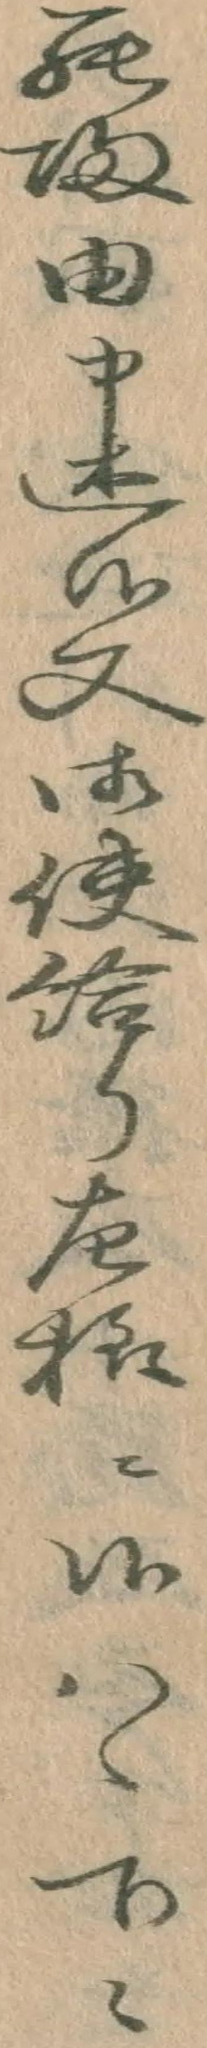罷帰由申述候又御使給り左様に候はゝ下々
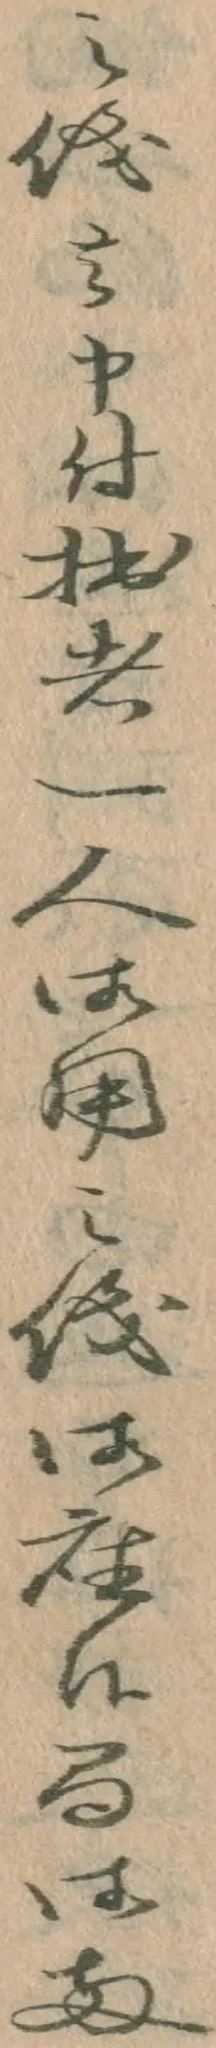之儀者申付拙者一人御用之儀御座候間御両
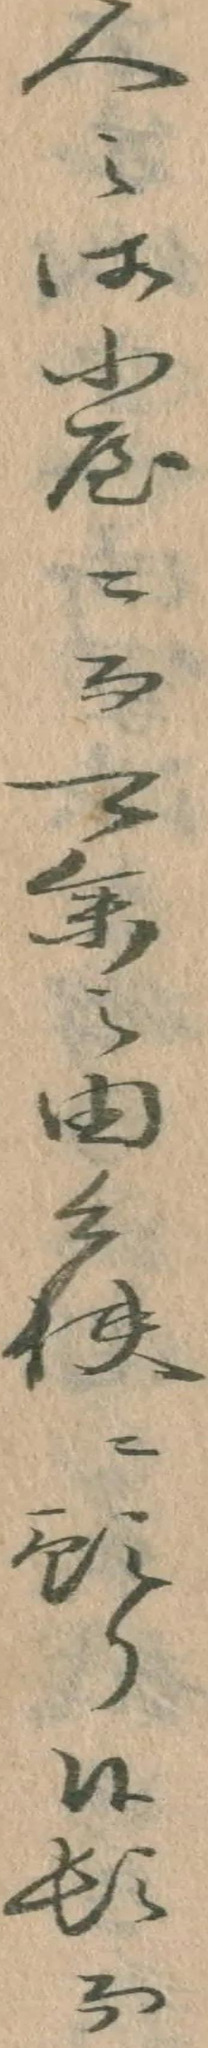人之御小屋に而可参之由今使に預り候頓而
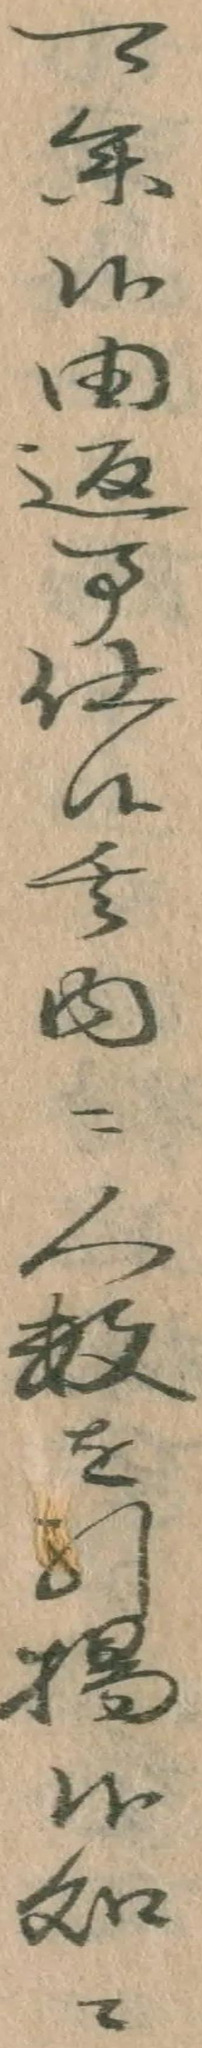可参候由返事仕候其内に人数を引揚候処に
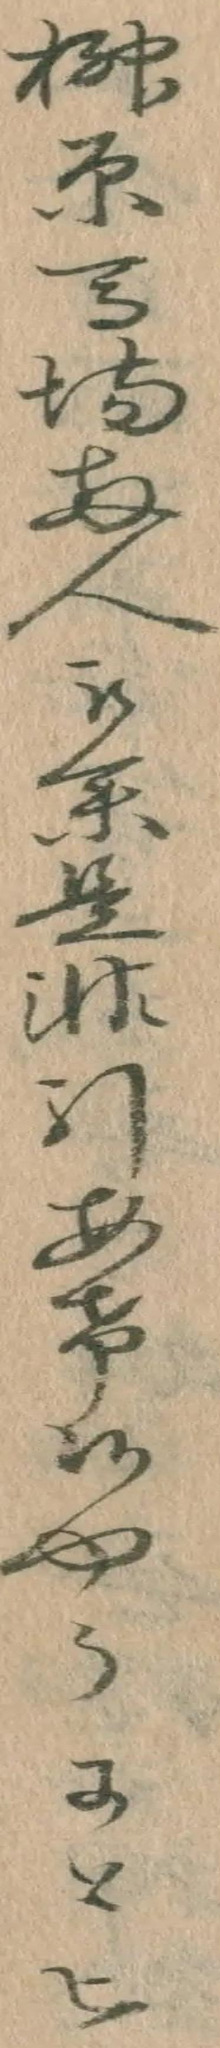榊原馬場両人被参是非引あ希候やう尓と被
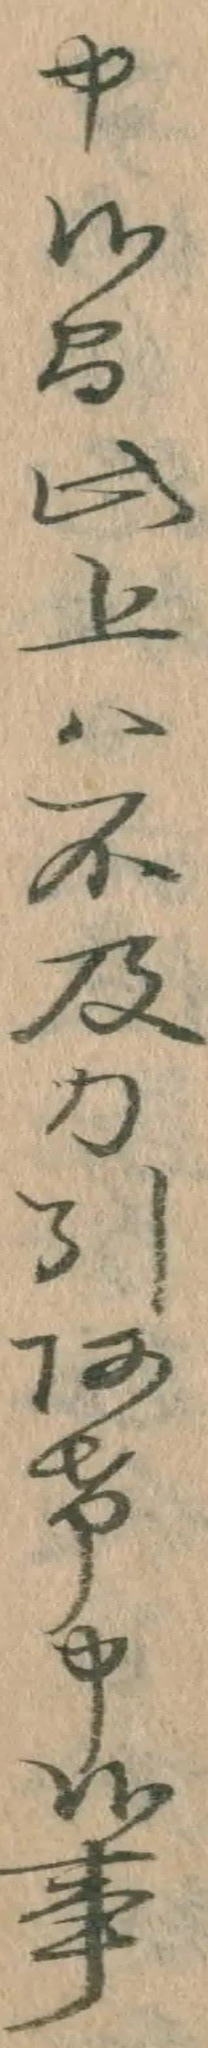申候間此上は不及力引阿希申候事
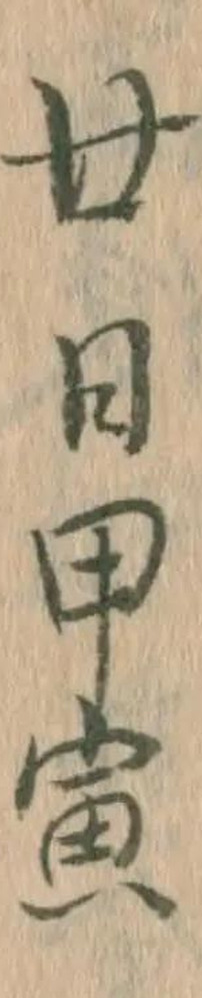廿日甲寅
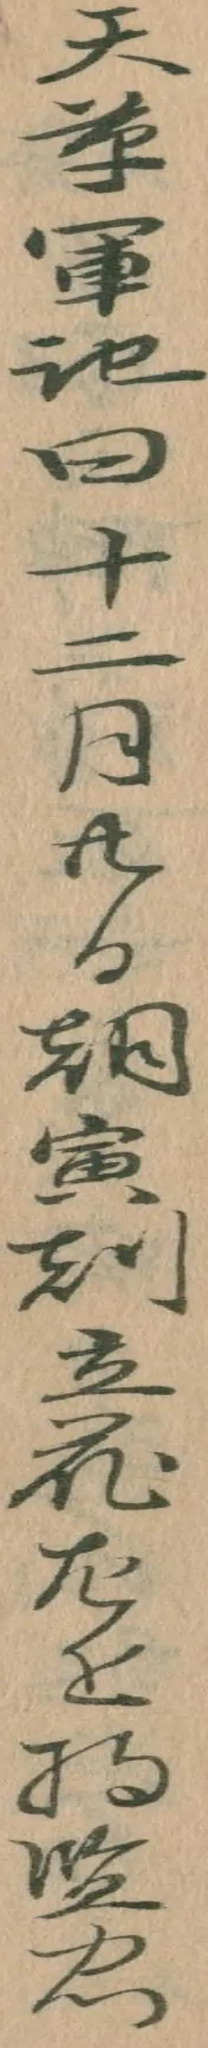天草軍記曰十二月廿日朝寅刻立花佐近将監忠
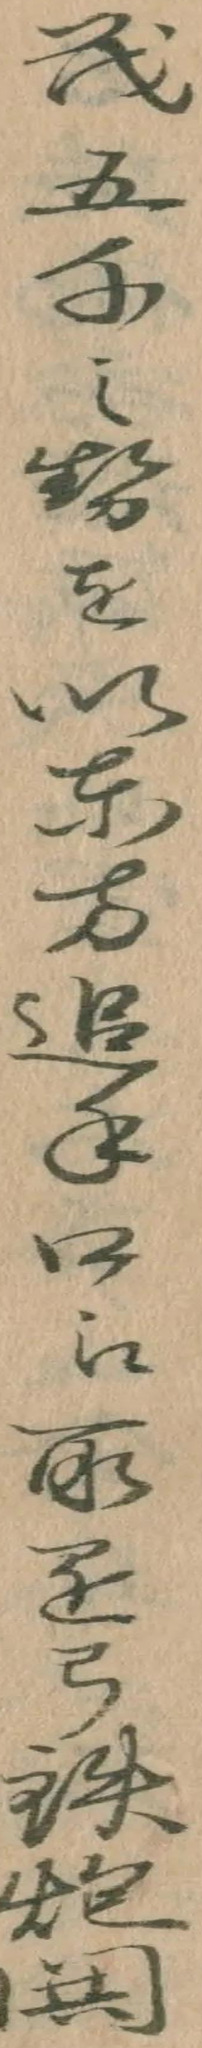茂五千之勢を以東方追手口得取懸弓鉄炮鬨
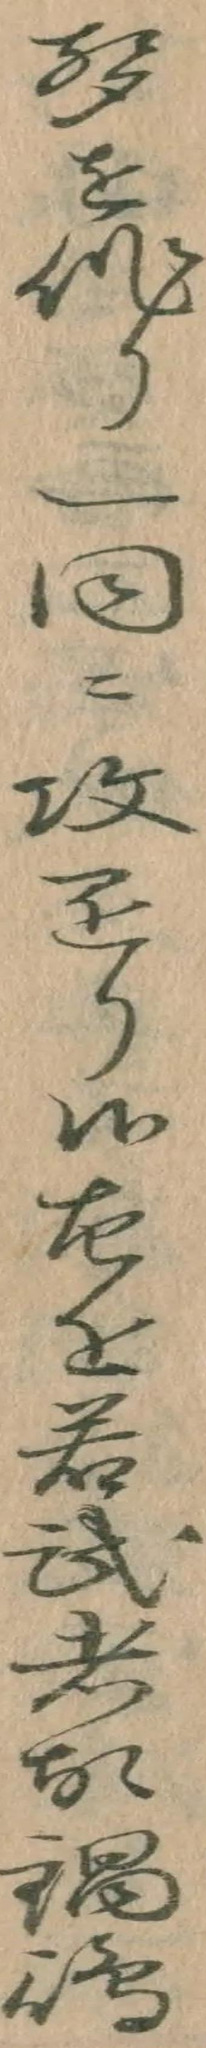声を作り一同に攻懸り候左近若武者故鍋島
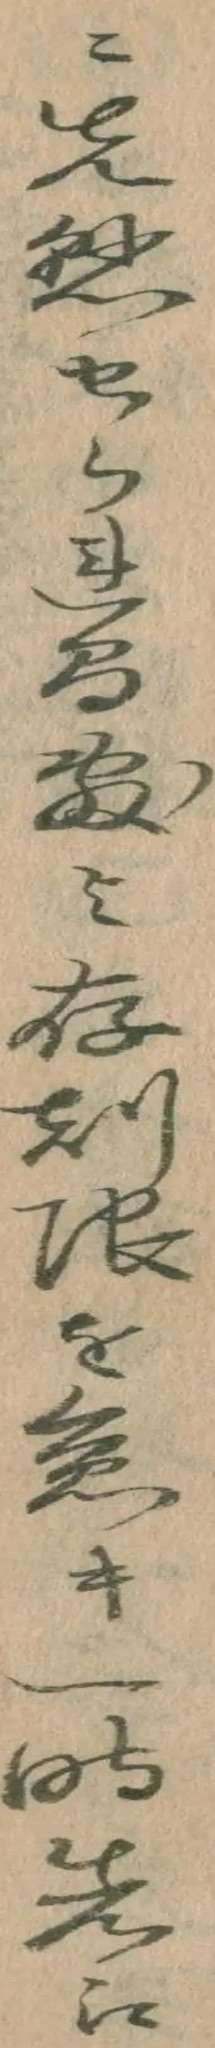に先懸せら連間敷与存刻限を急き一時先江
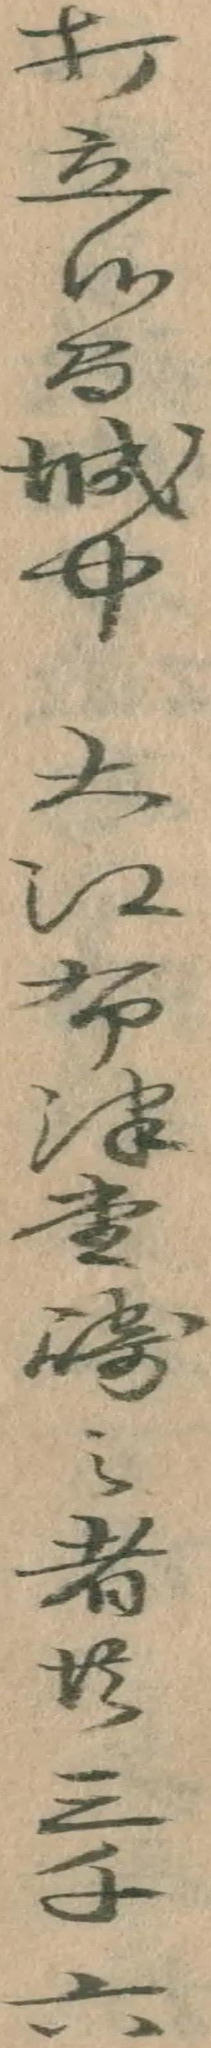打立候間城中大江布津堂崎之者共三千六
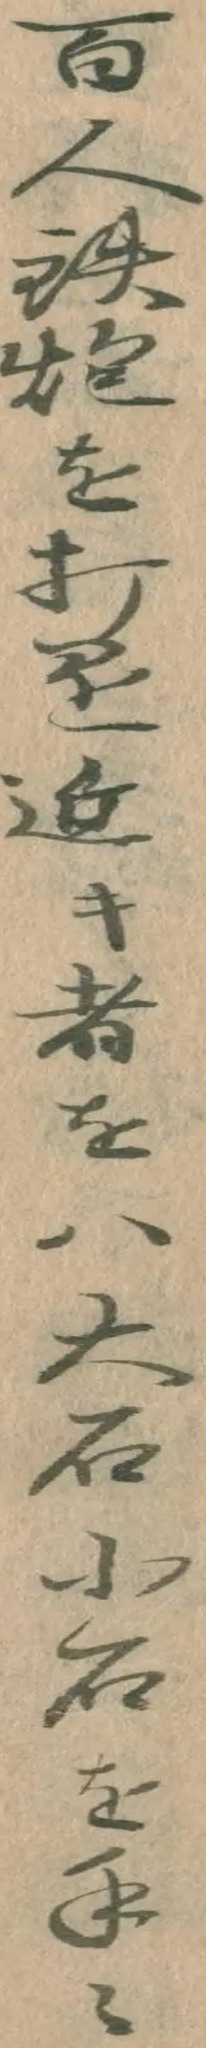百人鉄炮を打懸近き者をは大石小石を手々
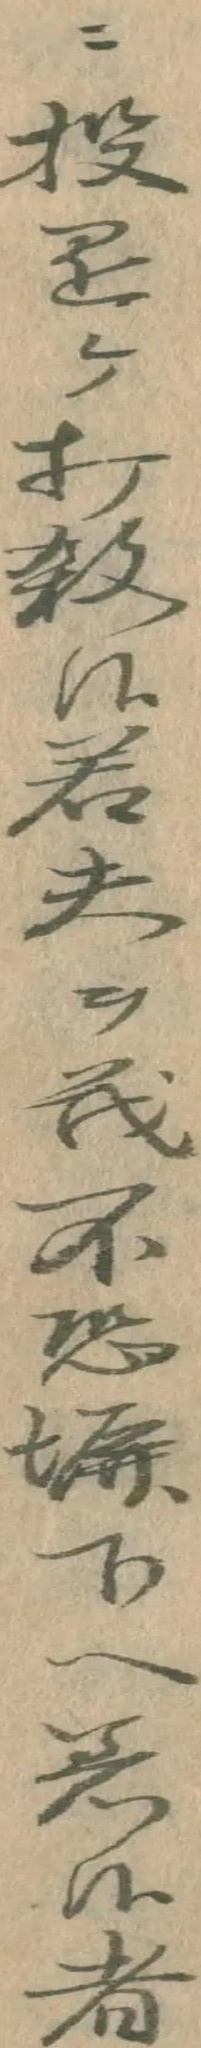に投懸け打数候若夫を茂不恐塀下へ着候者
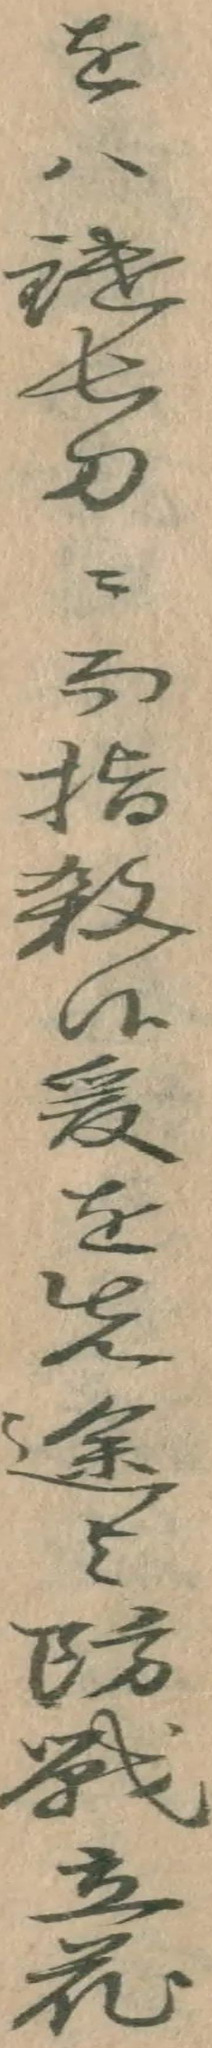をは鎗長刀に而指殺候爰を先途与防戦立花
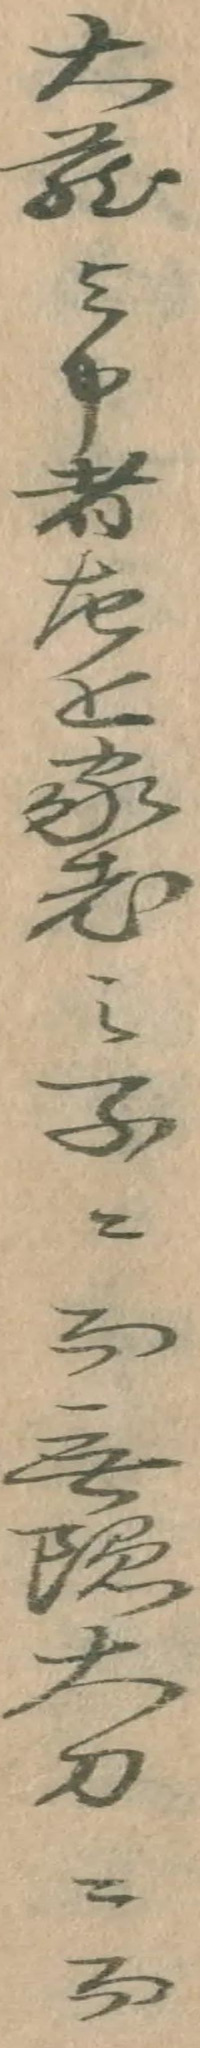大蔵与申者左近家老之子に而無隠大刀に而
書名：切支丹御退治記 49巻. [4]
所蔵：国立国会図書館 National Diet Library, JAPAN
